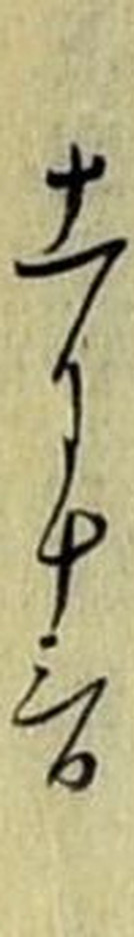十一月十三日
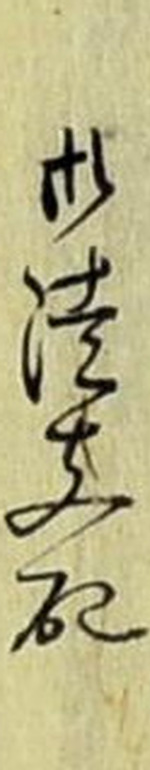御徒支配
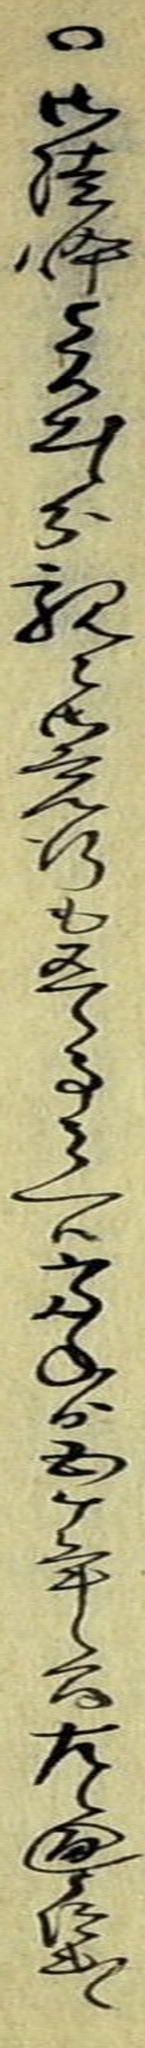○御徒忰被召出候分親之充行も有之事に候へは当年ゟ五ヶ年之間左之通被仰出候
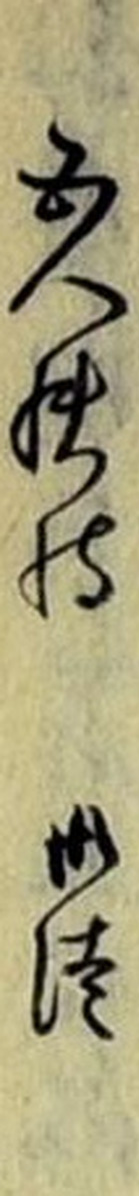五人扶持御徒
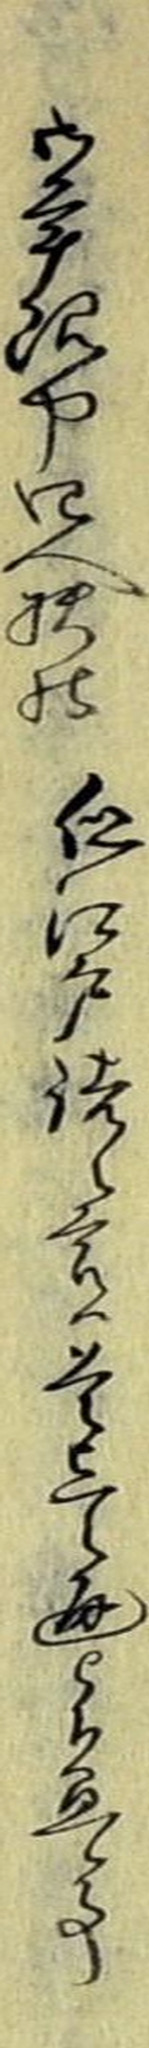御年限中四人扶持但江戸詰之節は是迄之通被下置候事
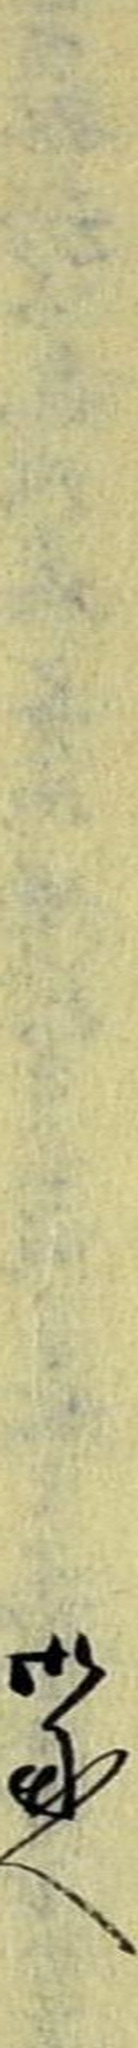御用人
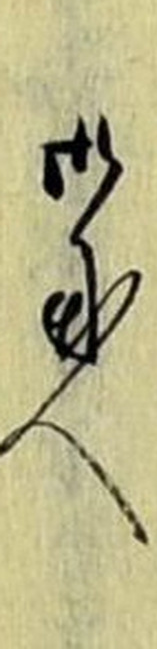御用人
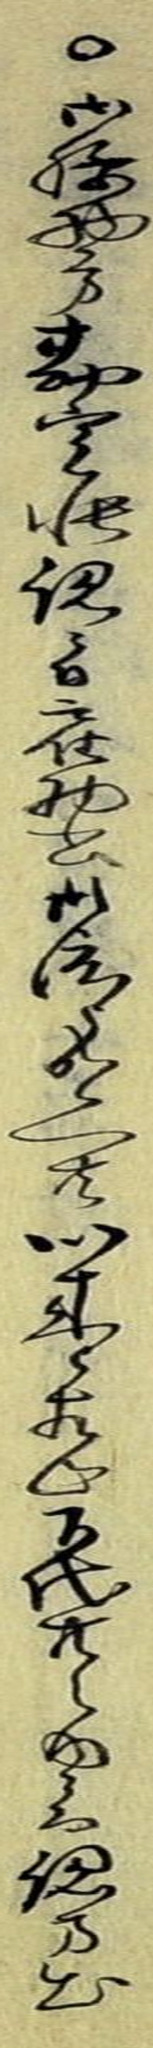○御腰物方勘定帳認に付雇物書御渡被成候へ共以来被相止下代共之内に而認方出
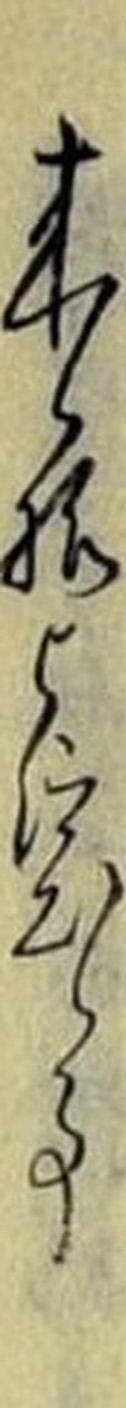来候様被仰出候事
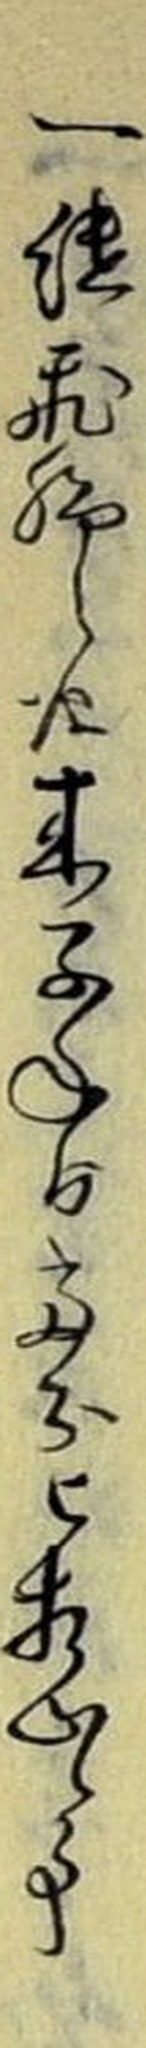一継飛脚之儀来子年ゟ当分被相止候事
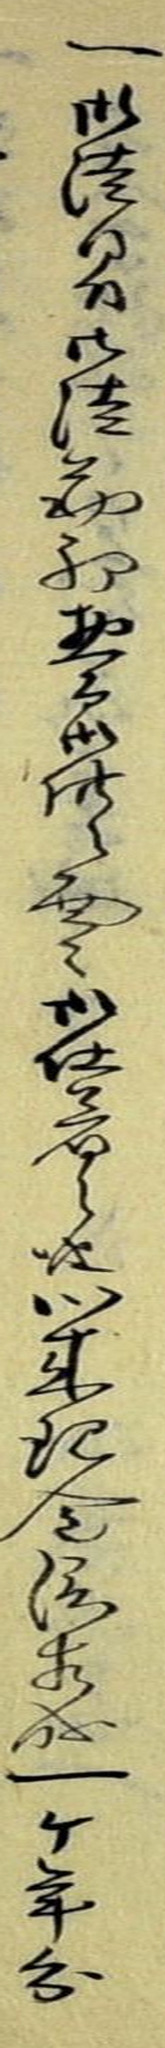一御徒目付御徒勤初惣而御供之面々御仕着之儀以來現金渡相成一ケ年分
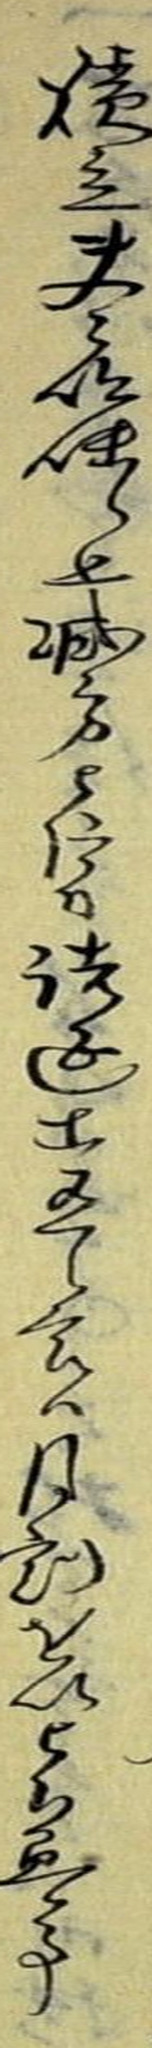積立夫々吟味之上減方被仰付詰延等有之節は月割を以被下置候事
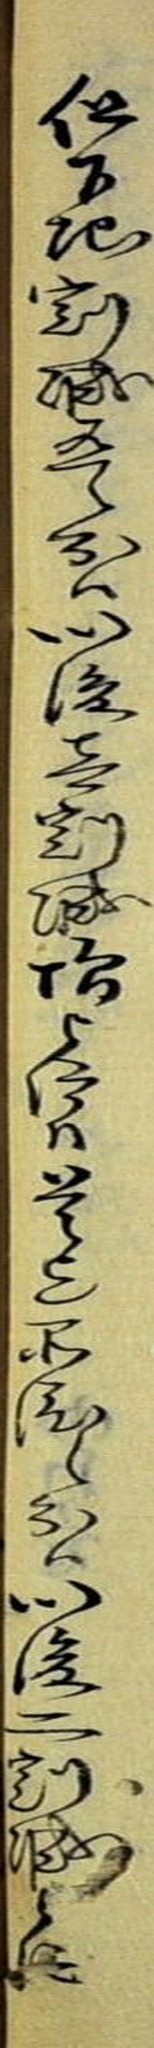但下地割減有之分は以後壱割減増に被仰付是迄品渡之分は以後弐割減被
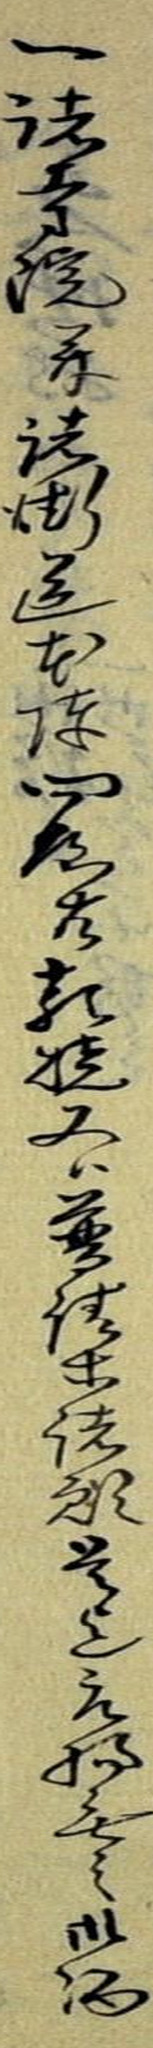一諸寺院并諸街道本陣問屋共類焼又は普請等諸願是迄取扱無之御酒
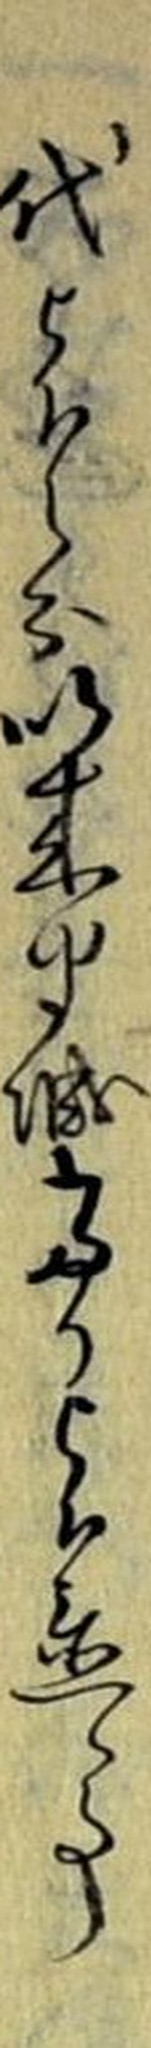代被下候分以来半減当り被下置候事
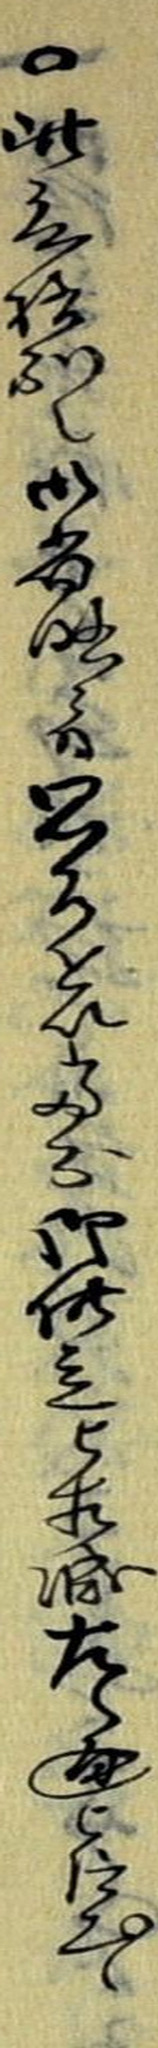○此度各別之御省略に付思召を以当分御供立被相減左之通被仰出候
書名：命令之部 六
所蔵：福井県文書館 Fukui Prefectural Archives
